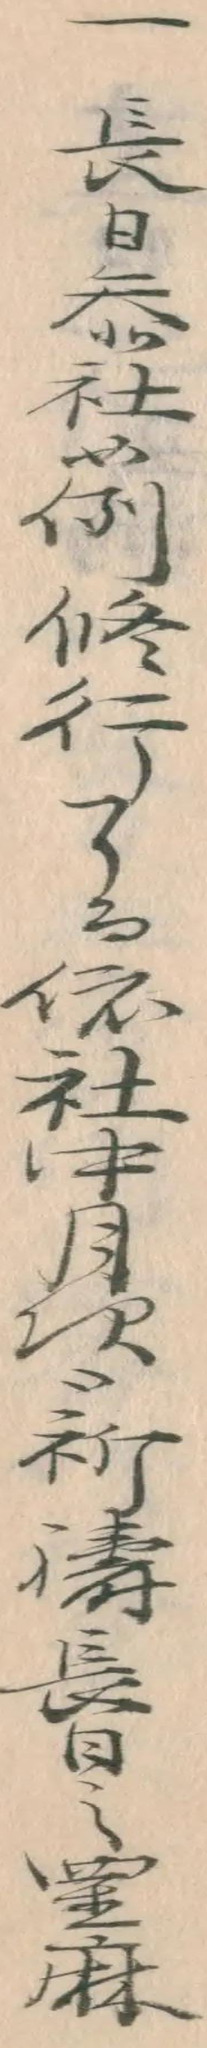一長日参社如例修行了而依社中月次御祈祷長日之置麻
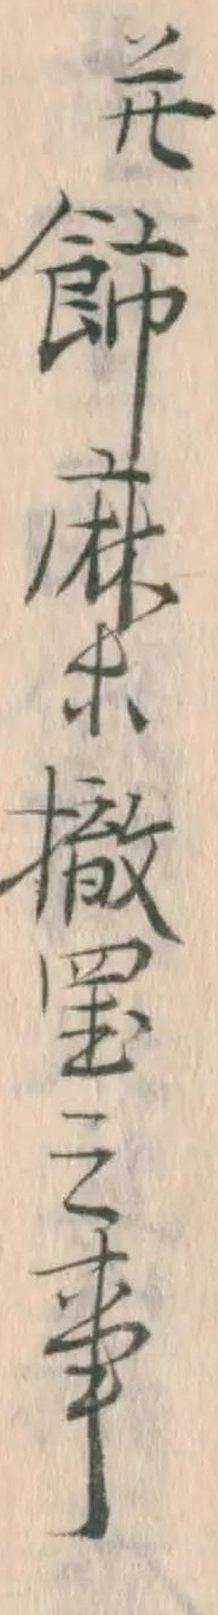并飾麻等撒置之事
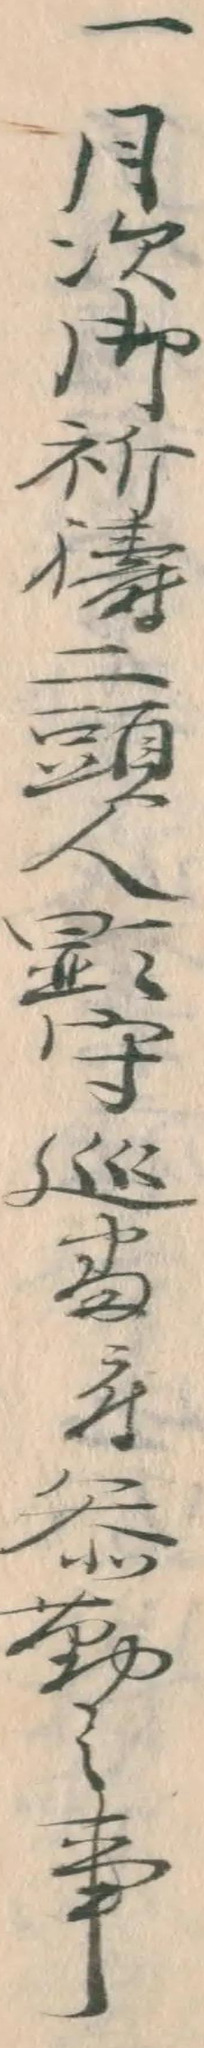一月次御祈祷二頭人顕守巡番ニ付参勤之事
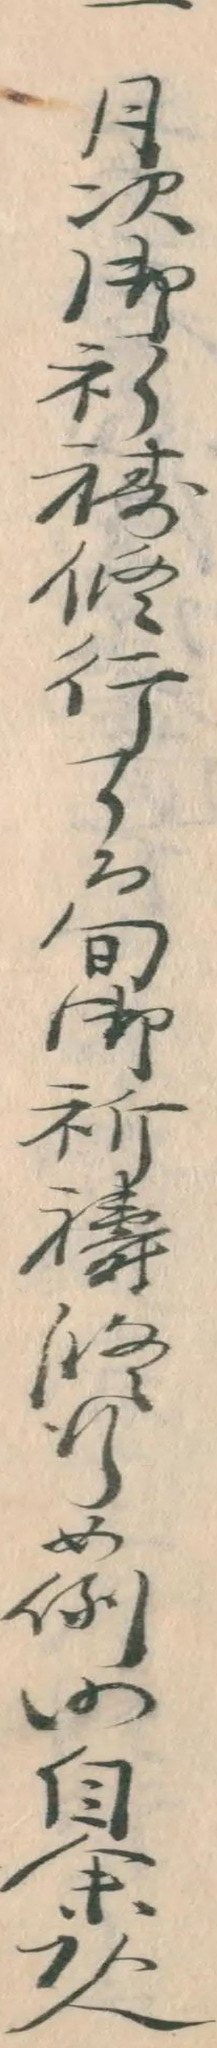一月次御祈禱修行了而旬御祈祷修行如例仍自余頭人
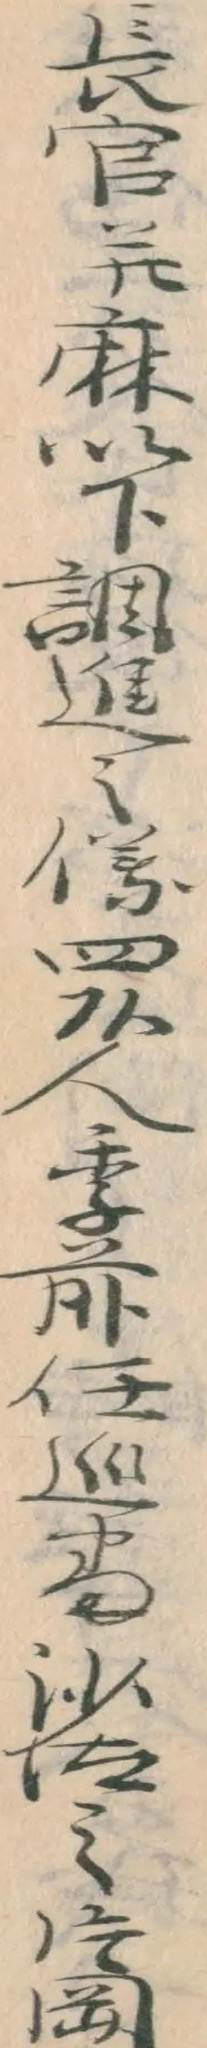長官并麻以下調進之儀四頭人季前任巡番沙汰之片岡

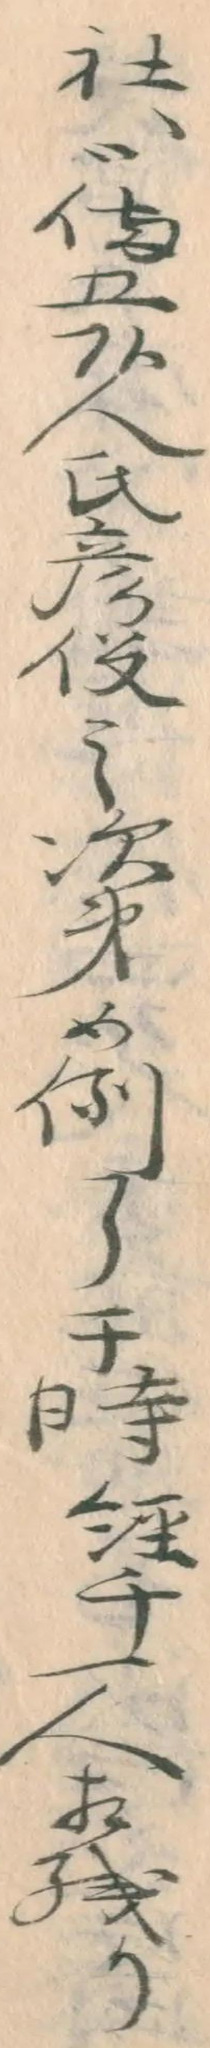社へ御備五頭人氏彦役之次第如例了于時経千一人相残リ
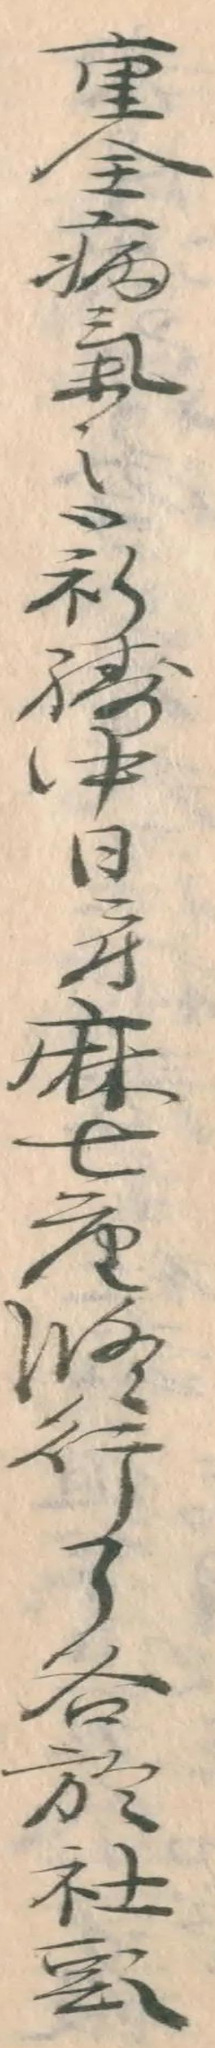重全病氣之御祈祷中日ニ付麻七座修行了各於社頭
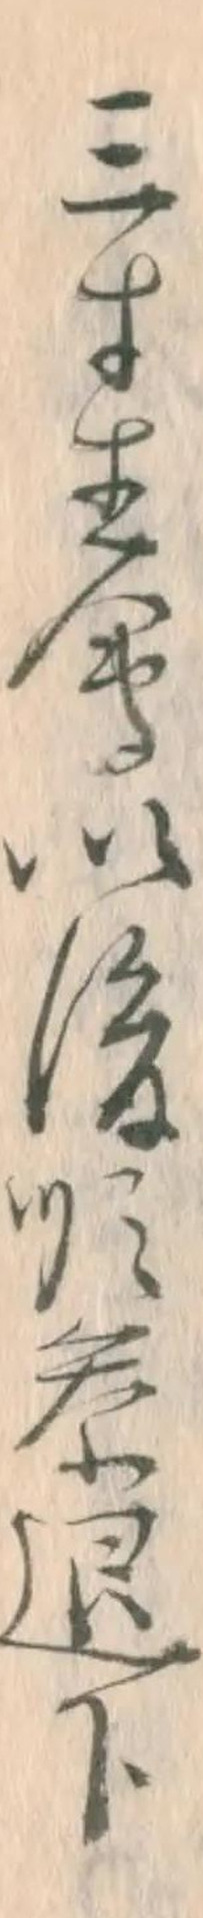三寸直會以後順参退下
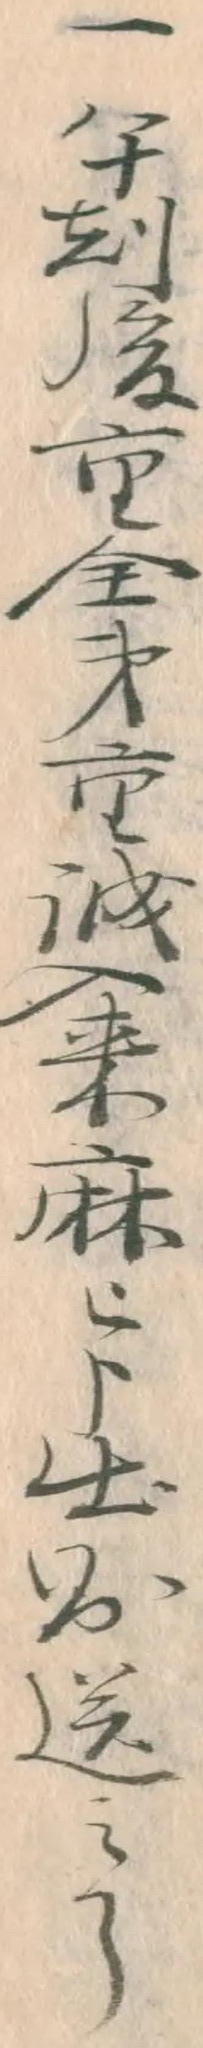一午刻後重全弟重誠入来麻被申出則送之了
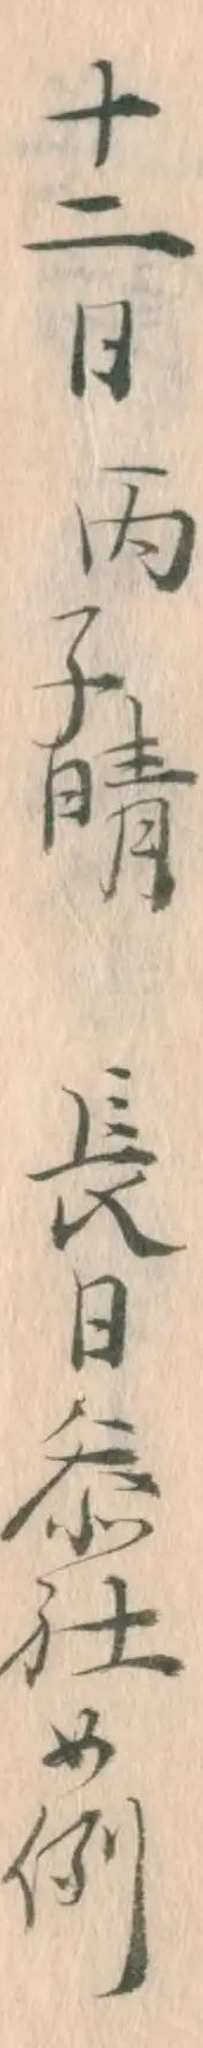十二日丙子晴長日参社如例
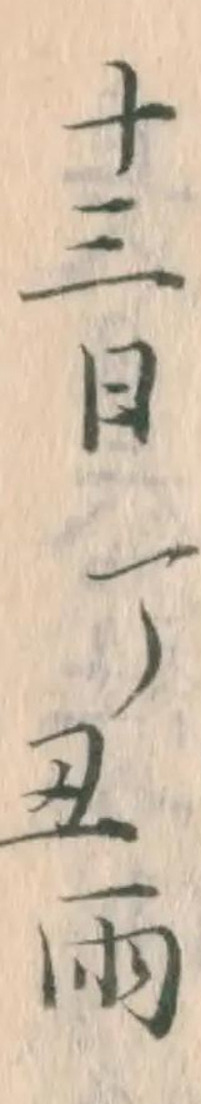十三日丁丑雨
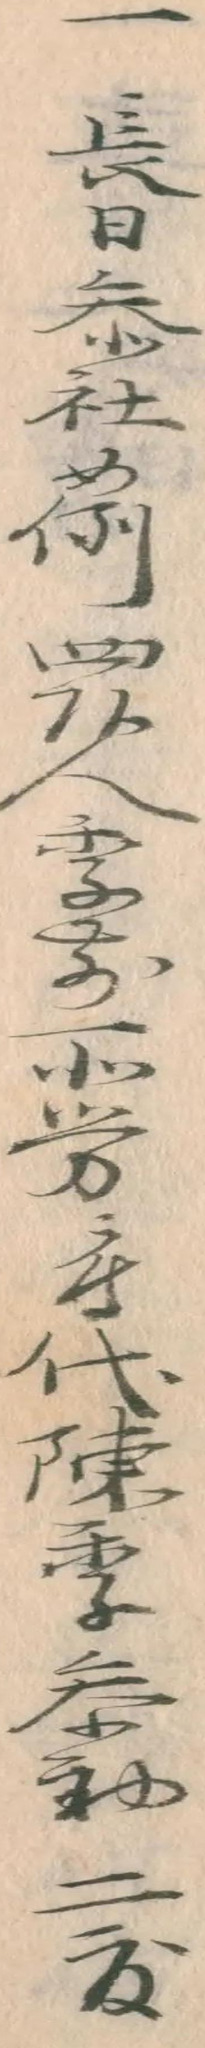一長日参社如例四頭人季前所労ニ付代陳季参勤二度
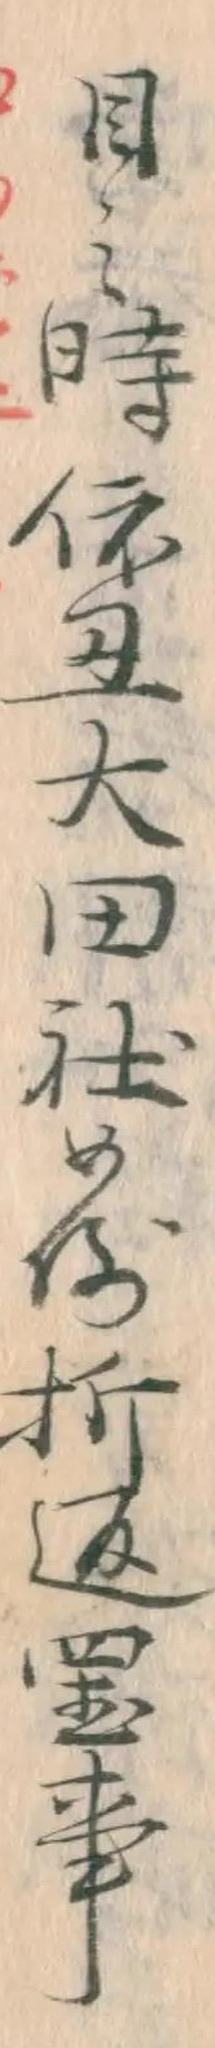目之時依丑大田社如例折返置事
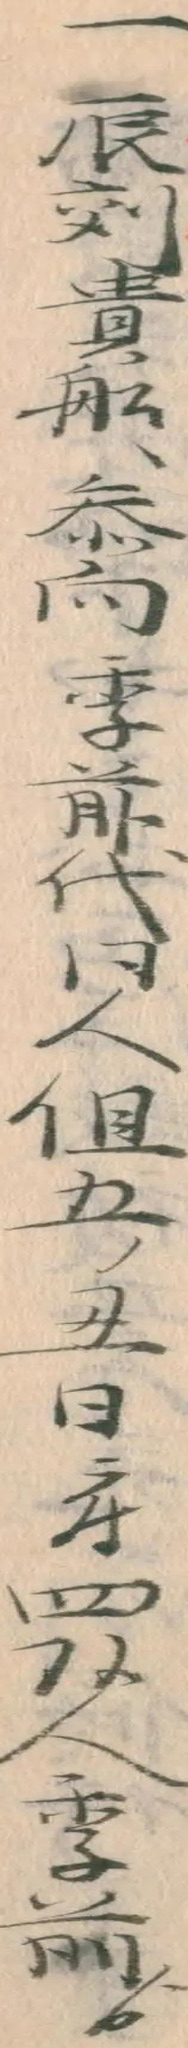一辰刻貴舩へ参向季前代同人但五ノ丑日ニ付四頭人季前ゟ
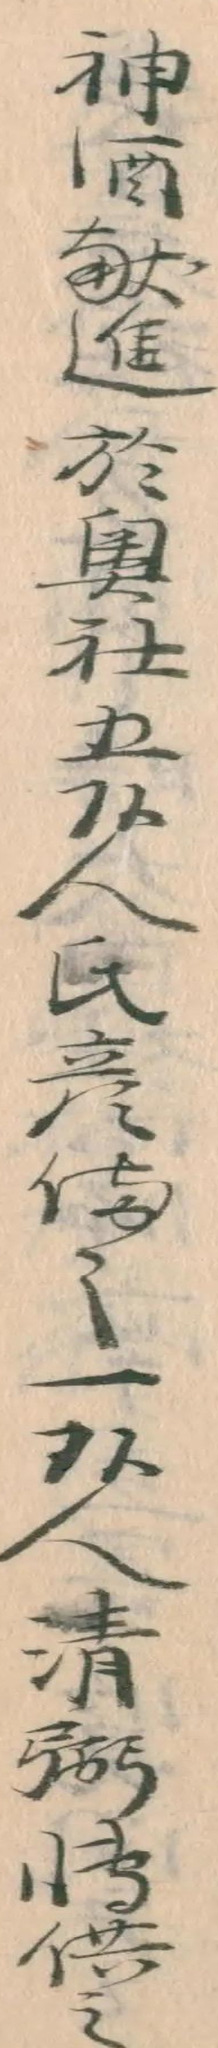神酒献進於奥社五頭人氏産備之一頭人清弼轉供之
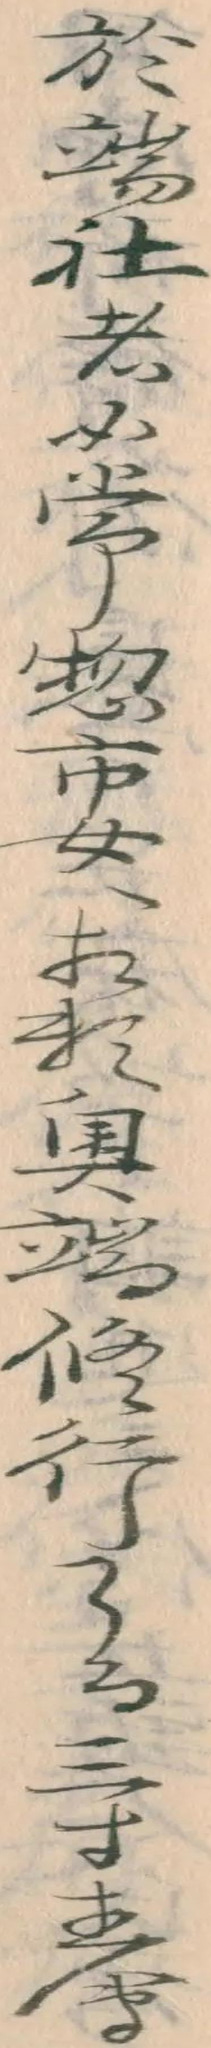於端社者如常惣市女へ相頼奥端修行了而三寸直會
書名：賀茂社記録. 第73冊
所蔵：国立国会図書館 National Diet Library, JAPAN
